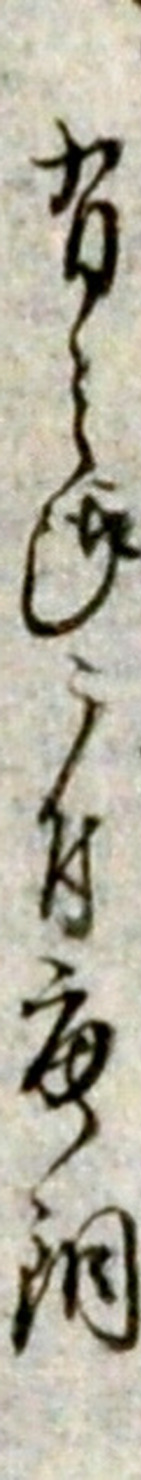有之趣ニ付唐銅
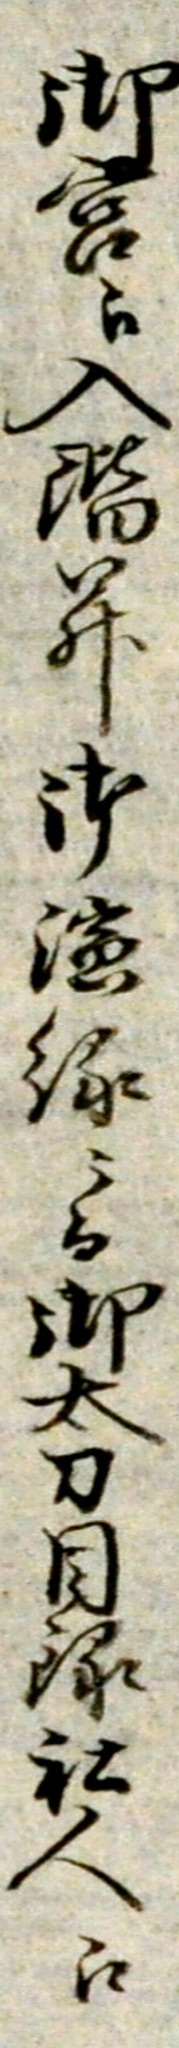御宮江入階昇御演縁ニ而御太刀目録社人江
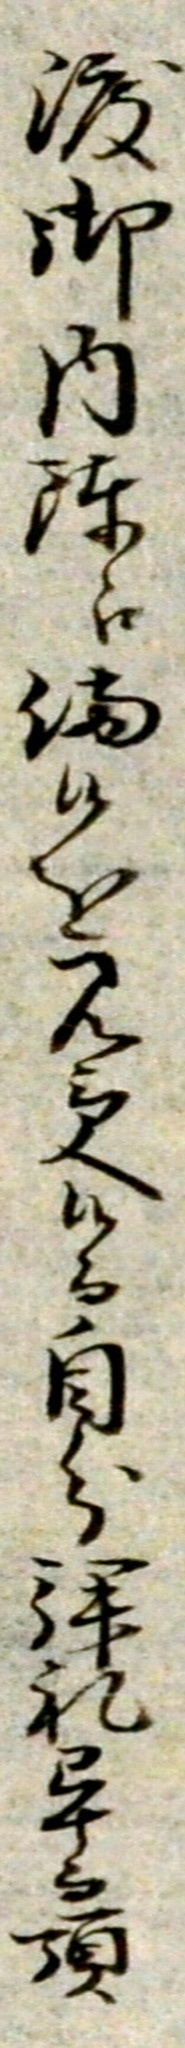渡御内陣江備候を見受候而自分拝礼畢而頂
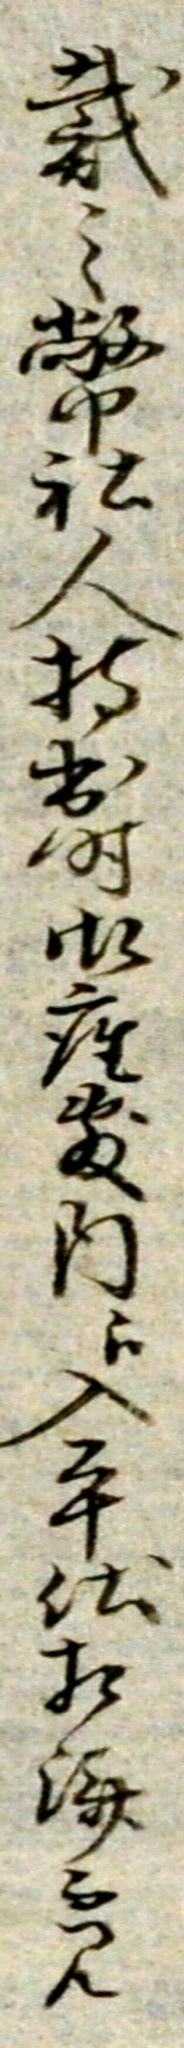戴之幣社人持出時御座敷内江入平伏相済而見
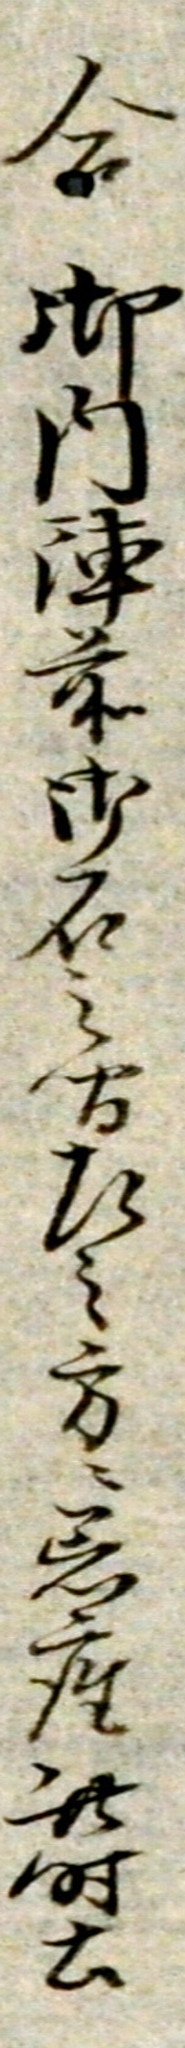合御内陣前御石之間左之方ニ着座此時土
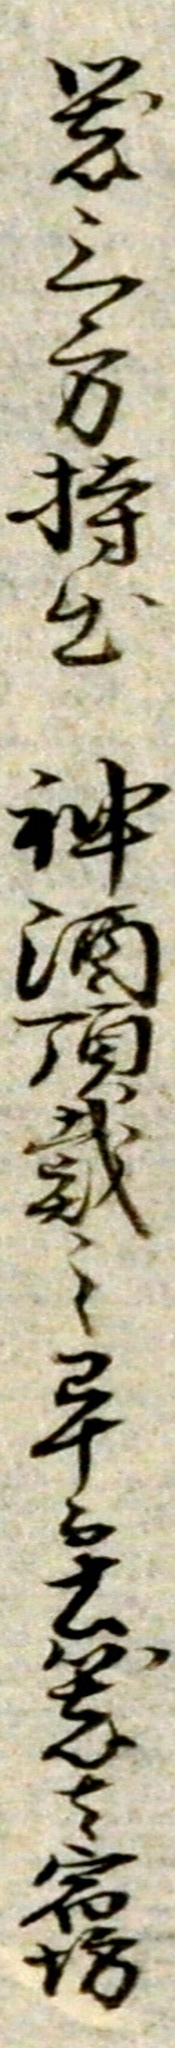器三方持出神酒頂戴之畢而土器者宿坊
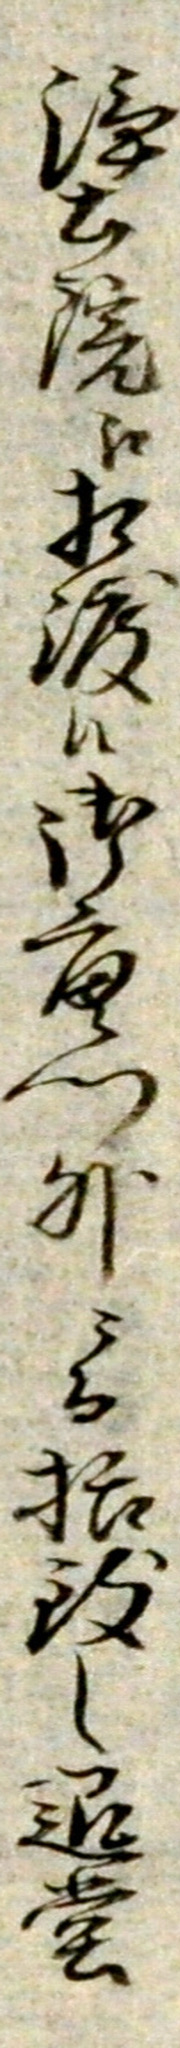浄土院江相渡候御唐門外ニ而括致し退堂
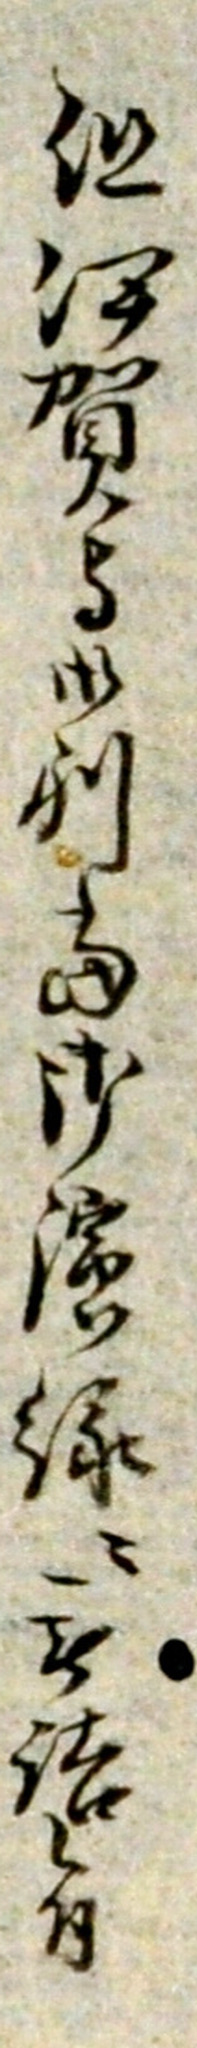但伊賀守御別当御演録ニ被詰ニ付
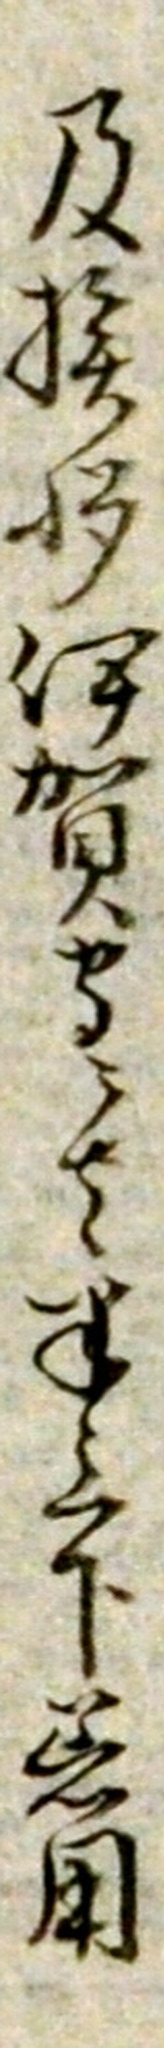及挨拶伊賀守ニ者半上下着用
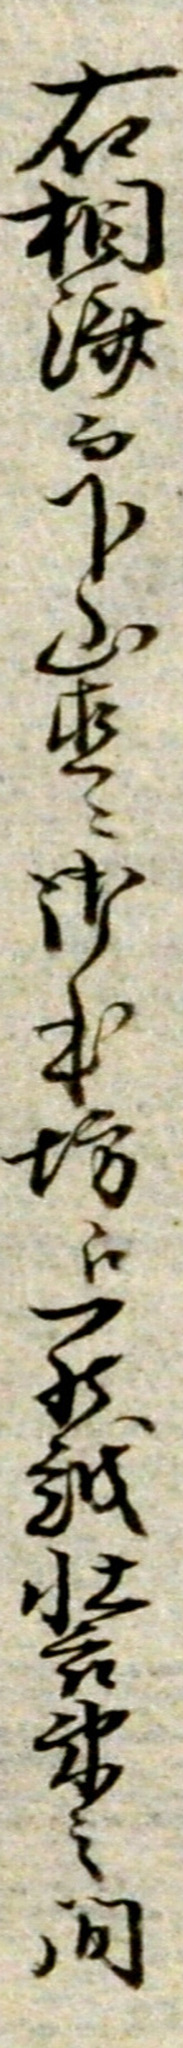右相済而下山直ニ御本坊江罷越装束之間
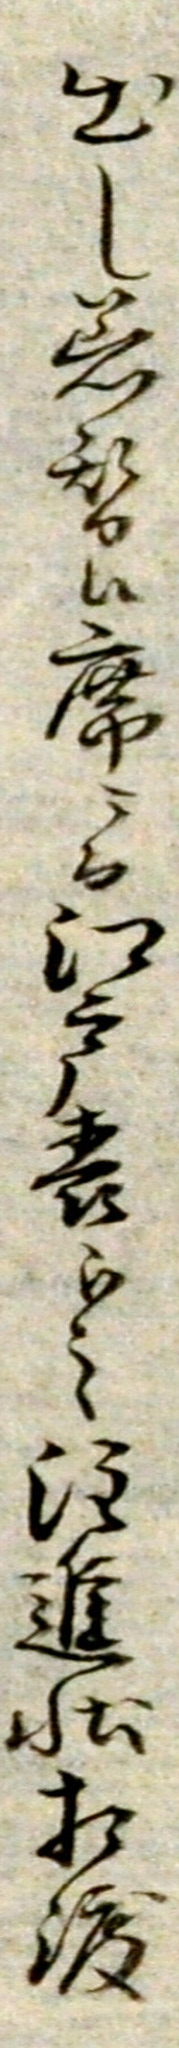先出し着替候席二而江戸表江之注進状相渡
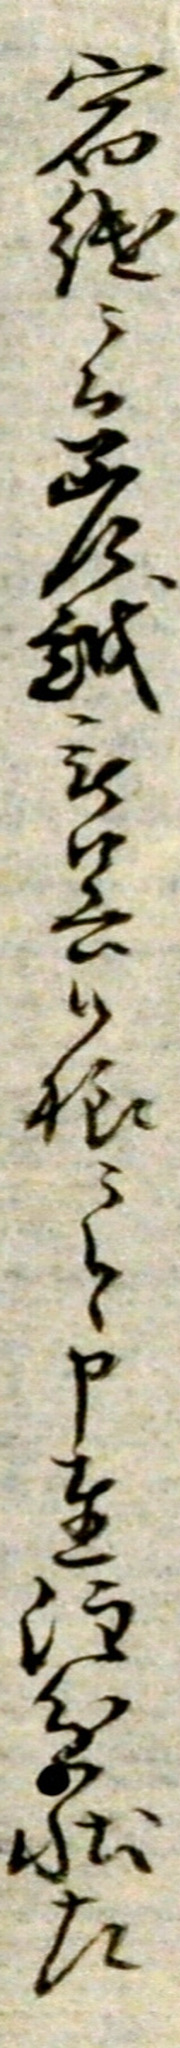宿継ニ而差越被答候様ニと申達注進状左
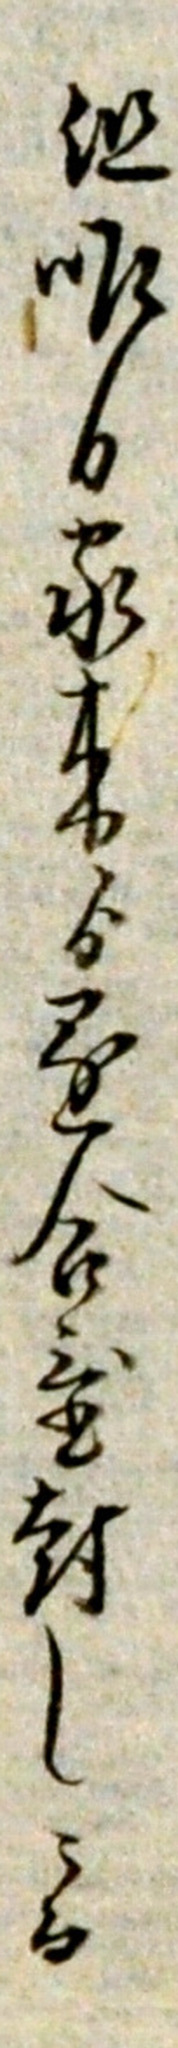但昨日家来ゟ懸合置封しニ而
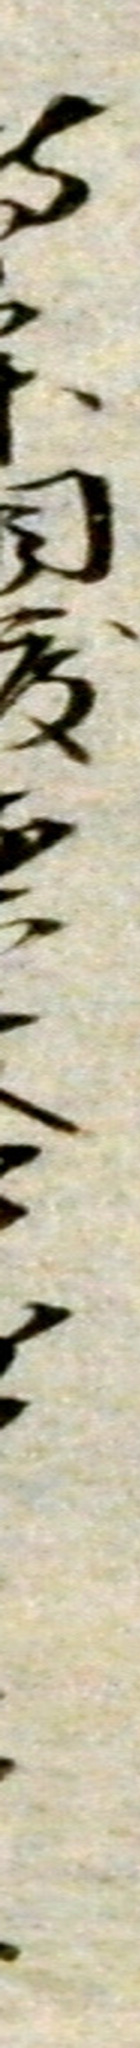持参相渡案文可進之旨申候

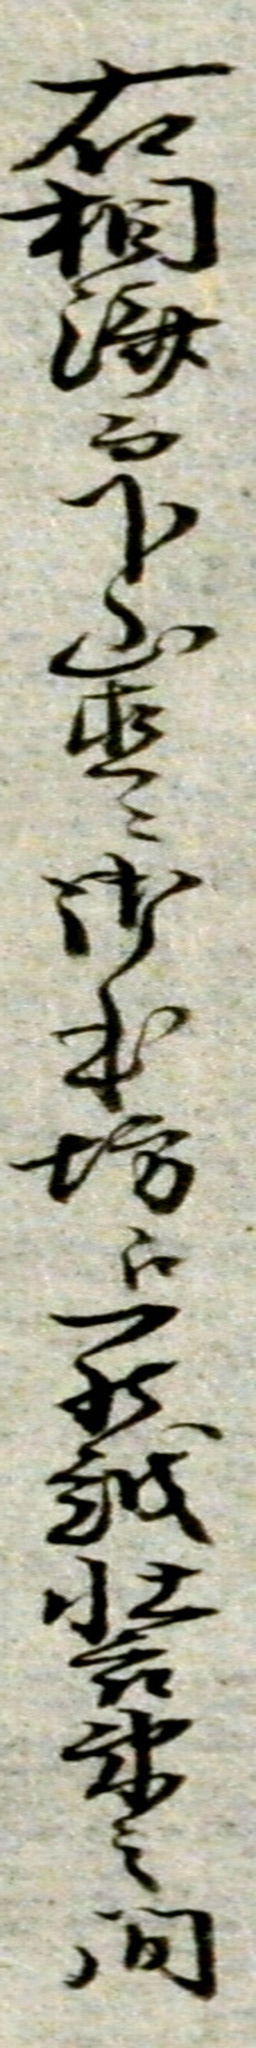右相済而下山直ニ御本坊江罷越装束之間
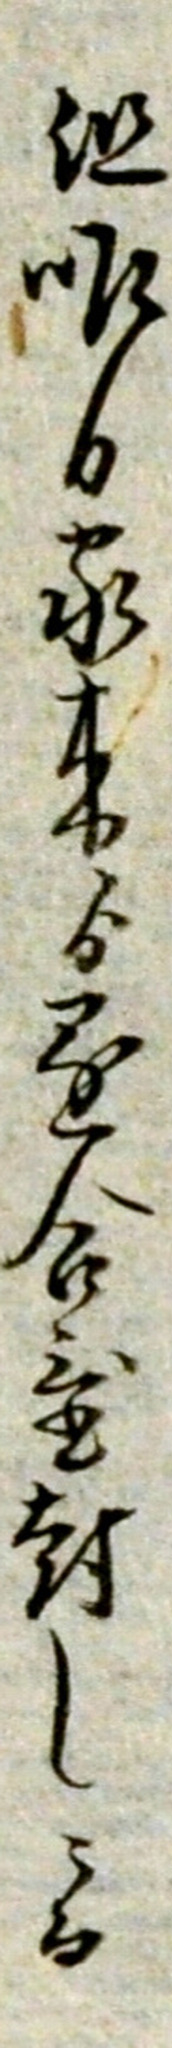但昨日家来ゟ懸合置封しニ而
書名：日光御名代相勤候節ノ留
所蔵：伊那市立高遠町図書館・合同会社AMANE
